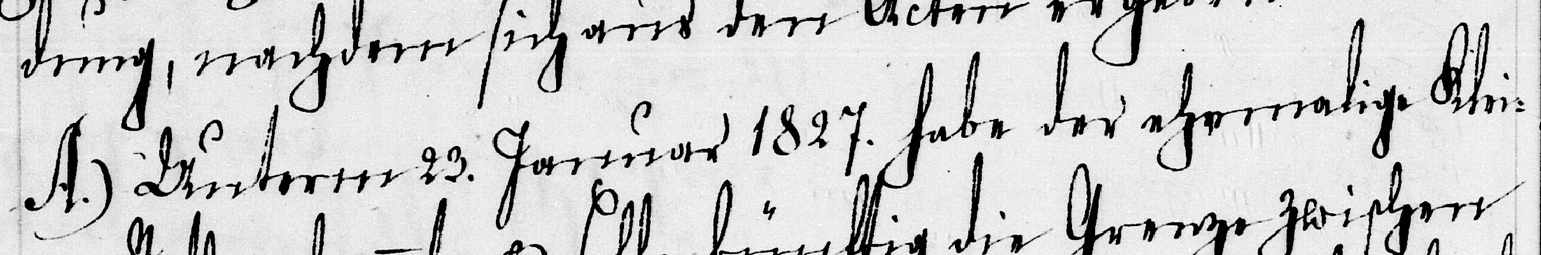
A.) Unterm 23. Januar 1827. habe der ehemalige Klei¬
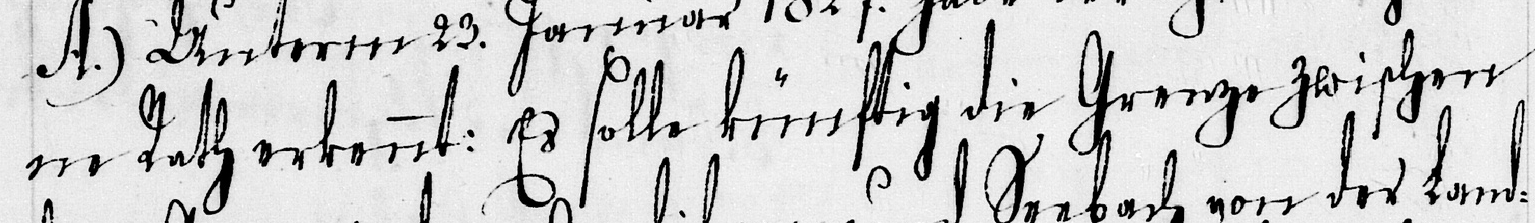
ne Rath erkannt: Es solle künftig die Grenze zwischen
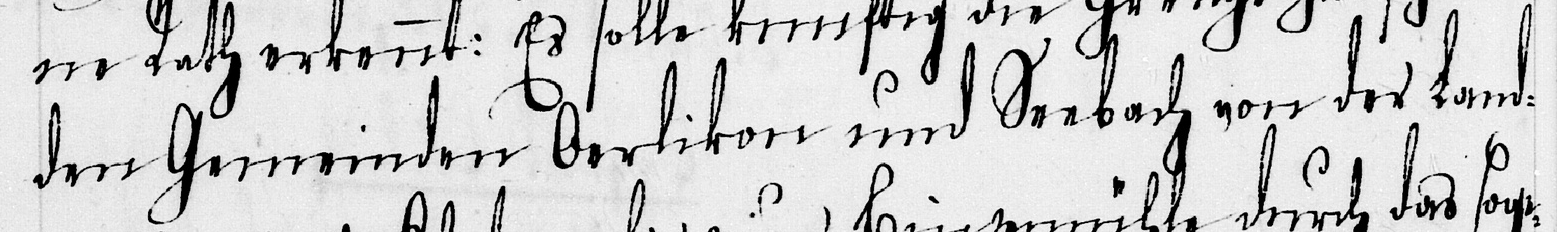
den Gemeinden Oerlikon und Seebach von der Land¬
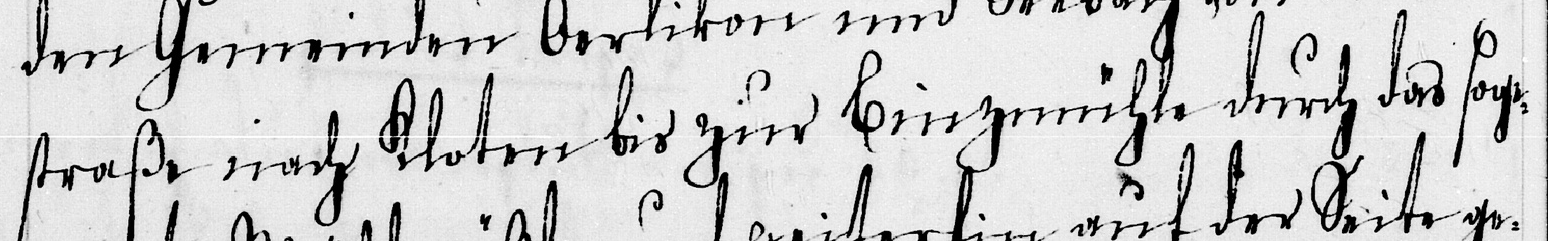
straße nach Kloten bis zur Binzmühle durch das sog¬
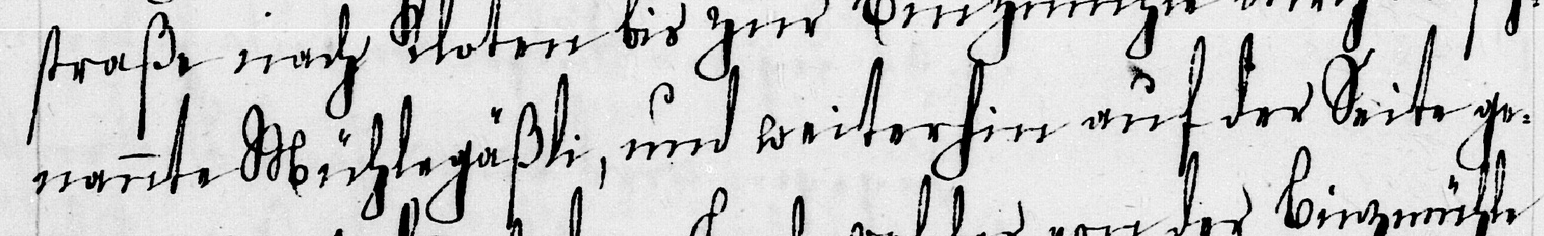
enannte Mühlegäßli, und weiterhin auf der Seite ge¬
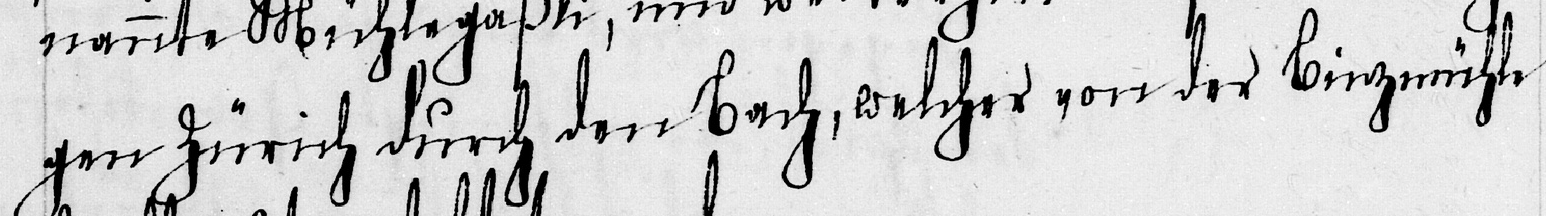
gen Zürich durch den Bach, welcher von der Binzmühle
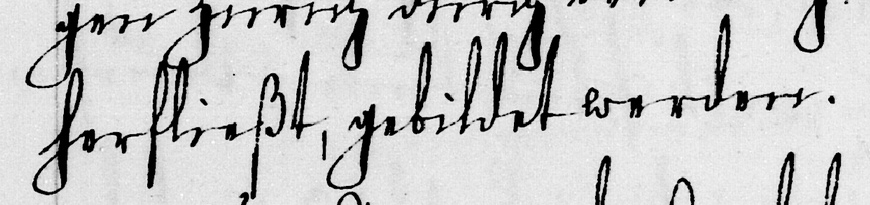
herfließt, gebildet werden.
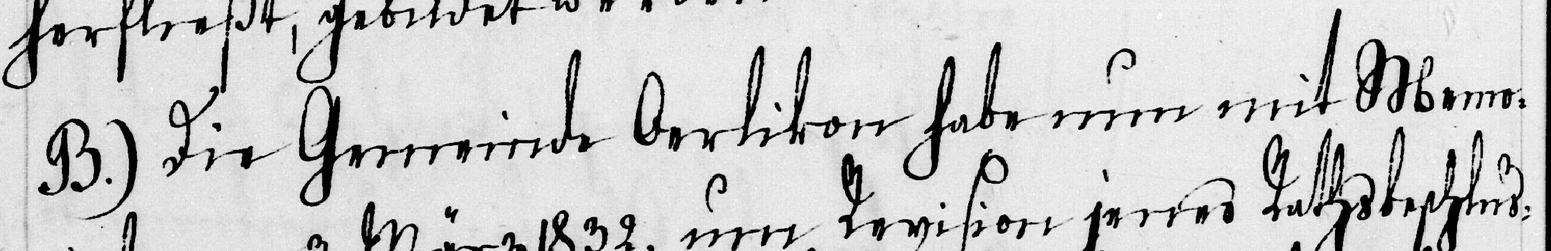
B.) Die Gemeinde Oerlikon habe nun mit Memo¬
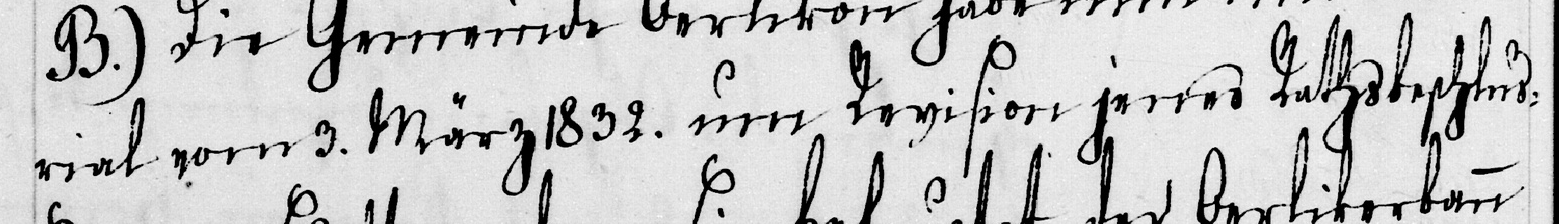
rial vom 3. März 1832. um Revision jenes Rathsbeschlu¬
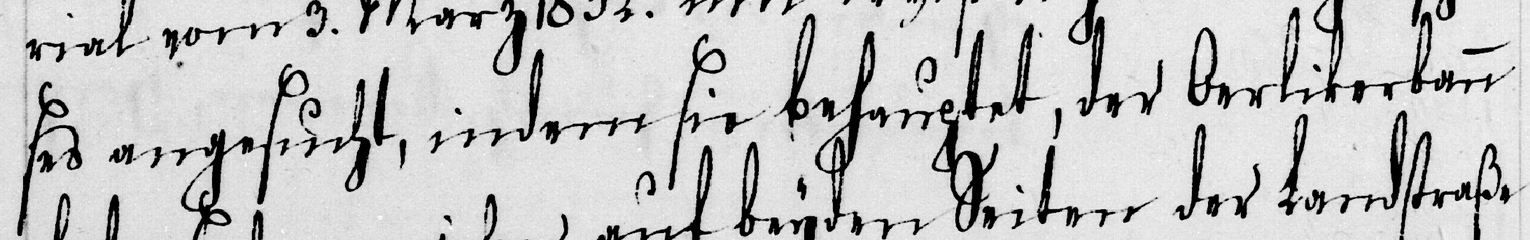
ßes angesucht, indem sie behauptet, der Oerlikerbann
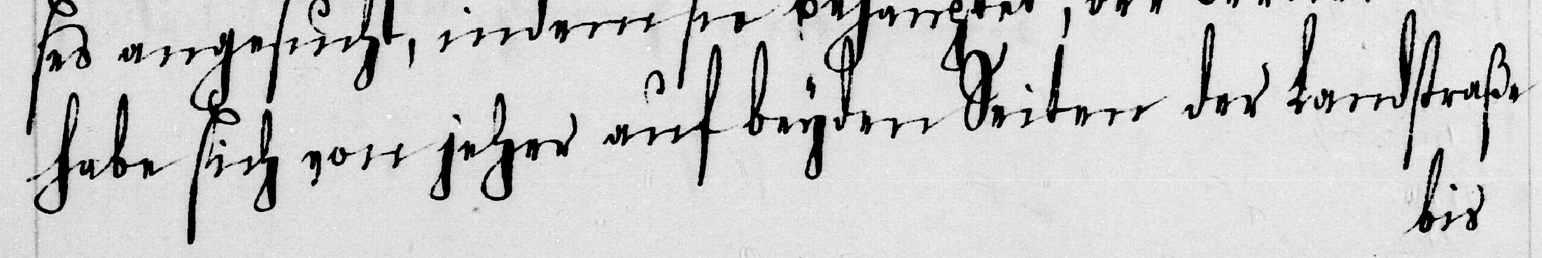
habe sich von jeher auf beyden Seiten der Landstraße
